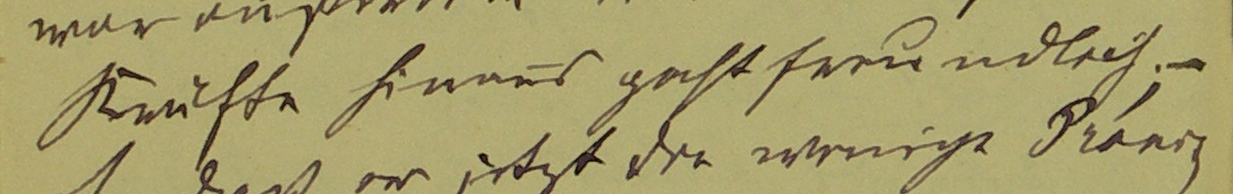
Kräfte hinaus gastfreundlich; -
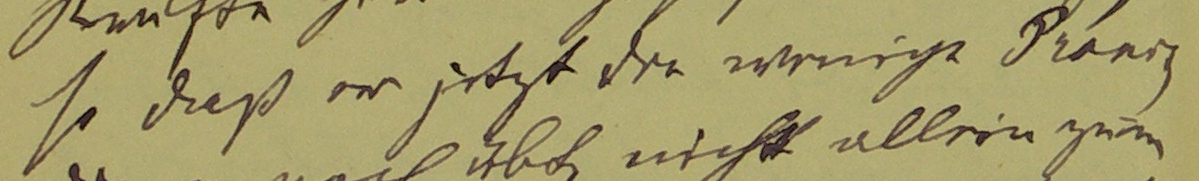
so das er jetzt die wenige Praxis,
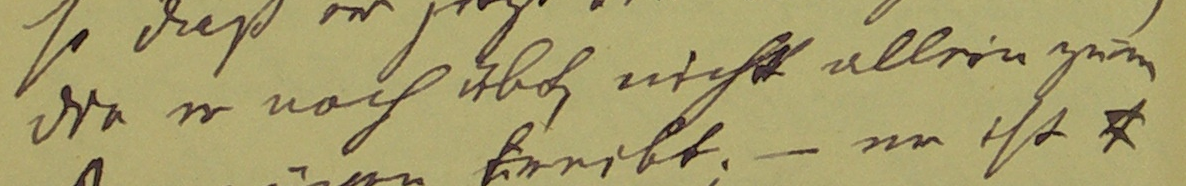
die er noch übt, nicht allein zum
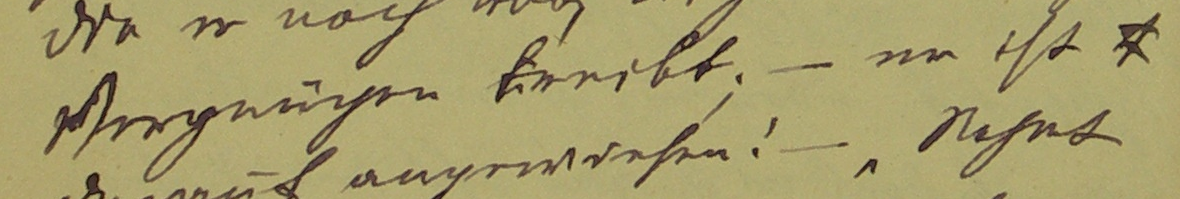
Vergnügen treibt, - er ist
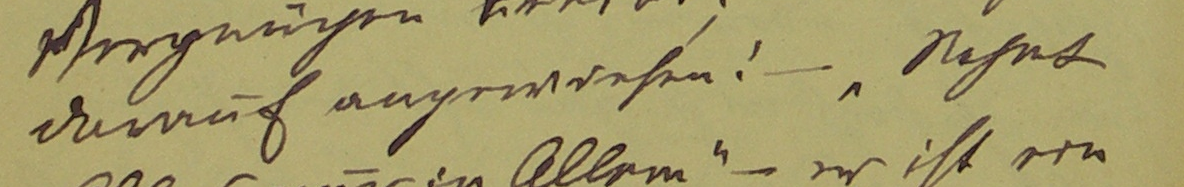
darauf angewiesen! - „ Nehmt
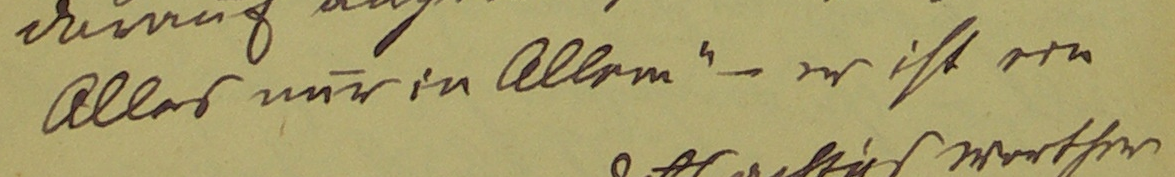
Alles nur in Allem“ - er ist ein
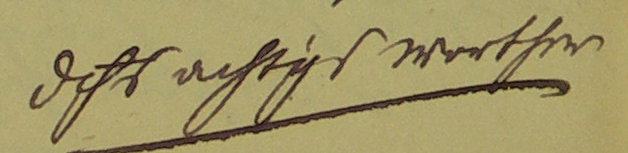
durchaus achtungswerther
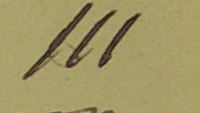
111
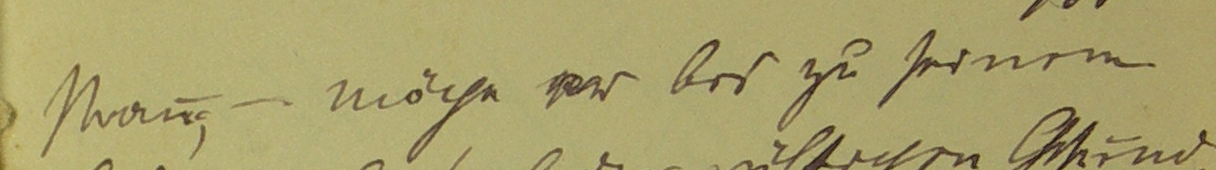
Mann, - möge er bis zu seinem
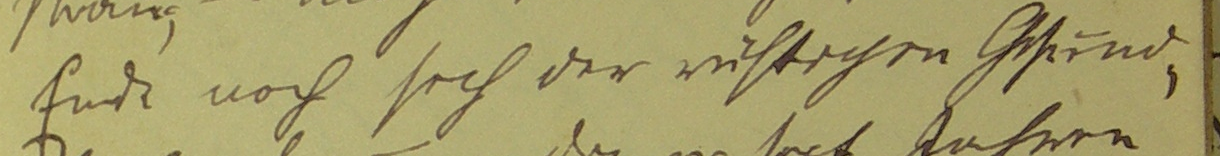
Ende noch sich der rüstigen Gesund¬
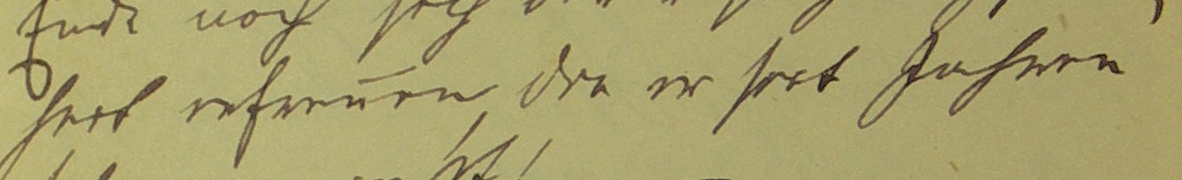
heit erfreuen, die er seit Jahren
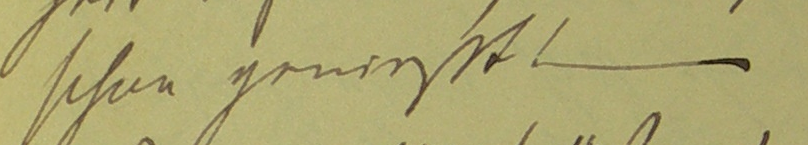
schon genießt.—
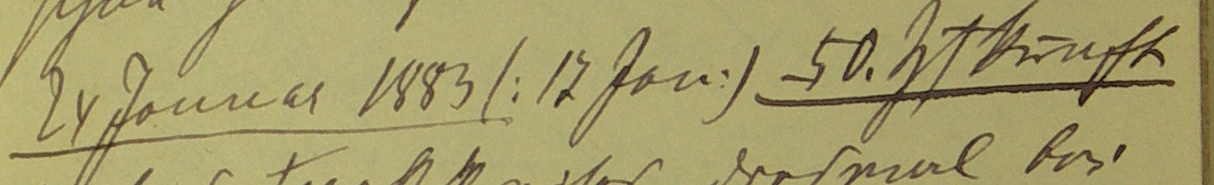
24. Januar 1883 (.17.Jan: ) - 50. Zskunft
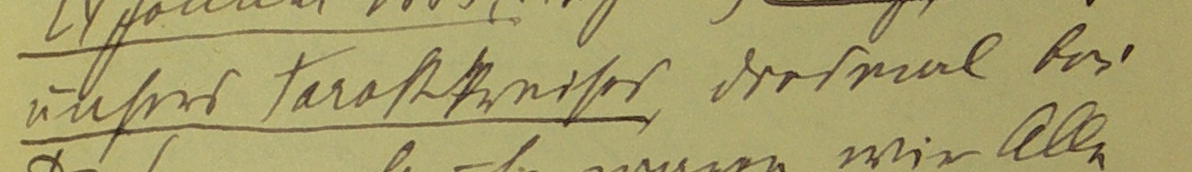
unsers Tarokkreises diesmal
